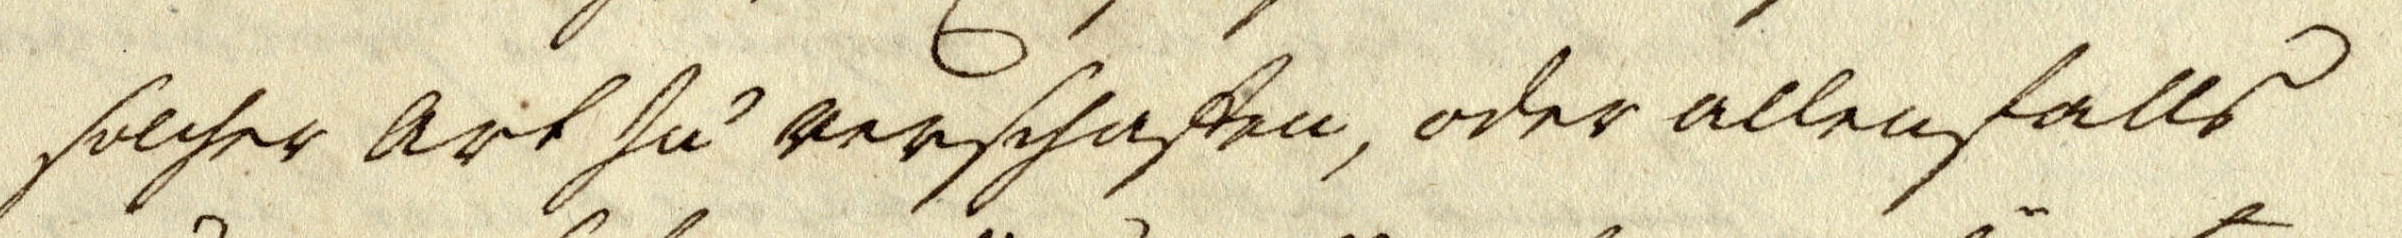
solcher Art zu verschaffen, oder allenfalls
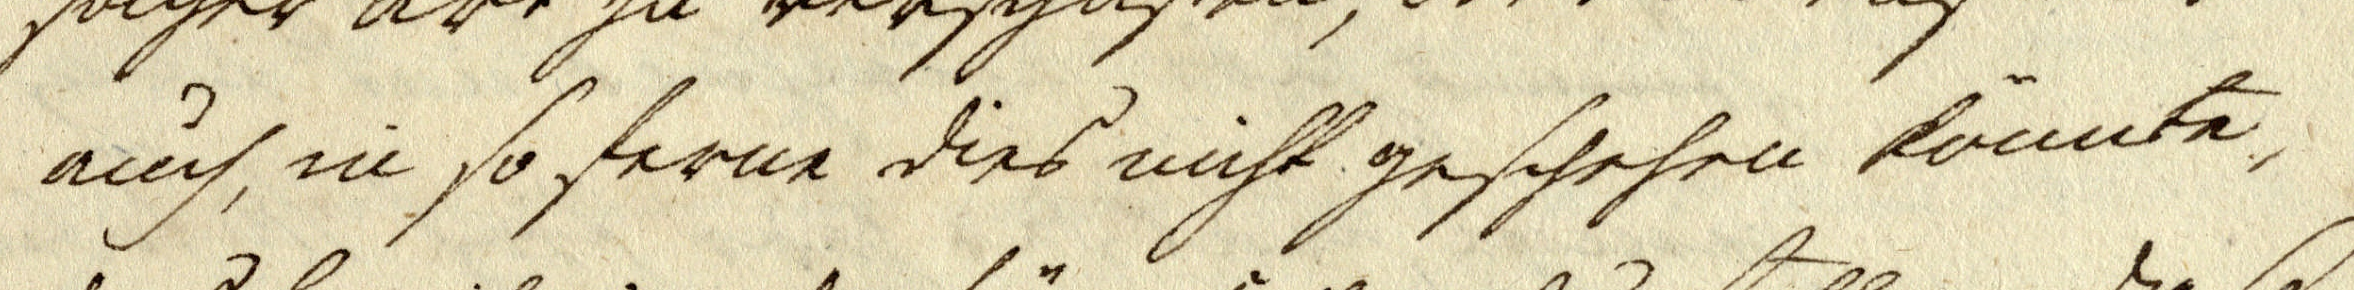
auch in so ferne dies nicht geschehen könnte,
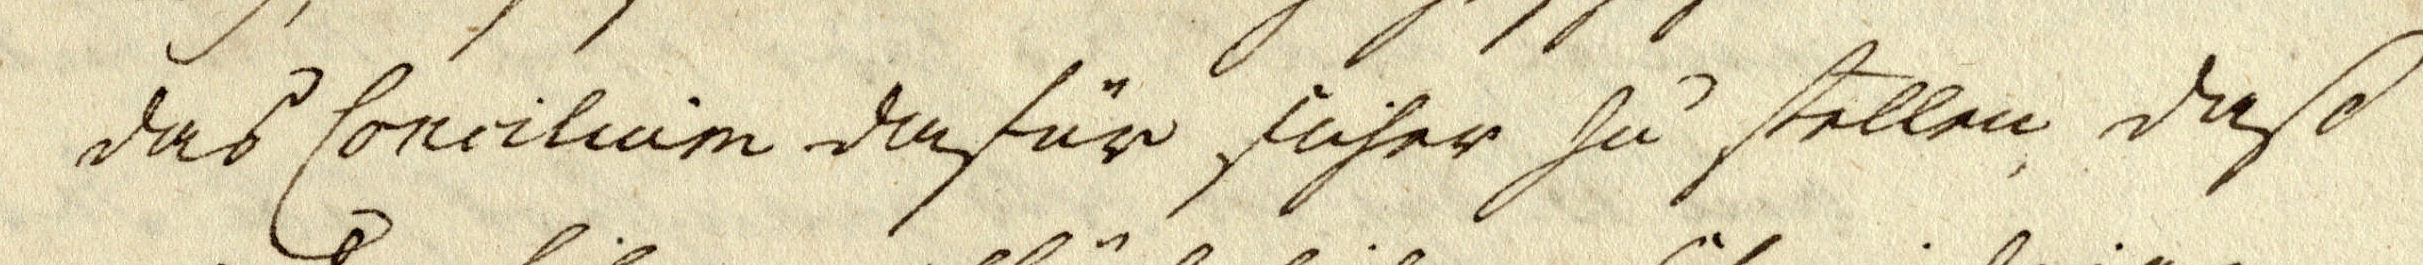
das Concilium dafür sicher zu stellen, daß
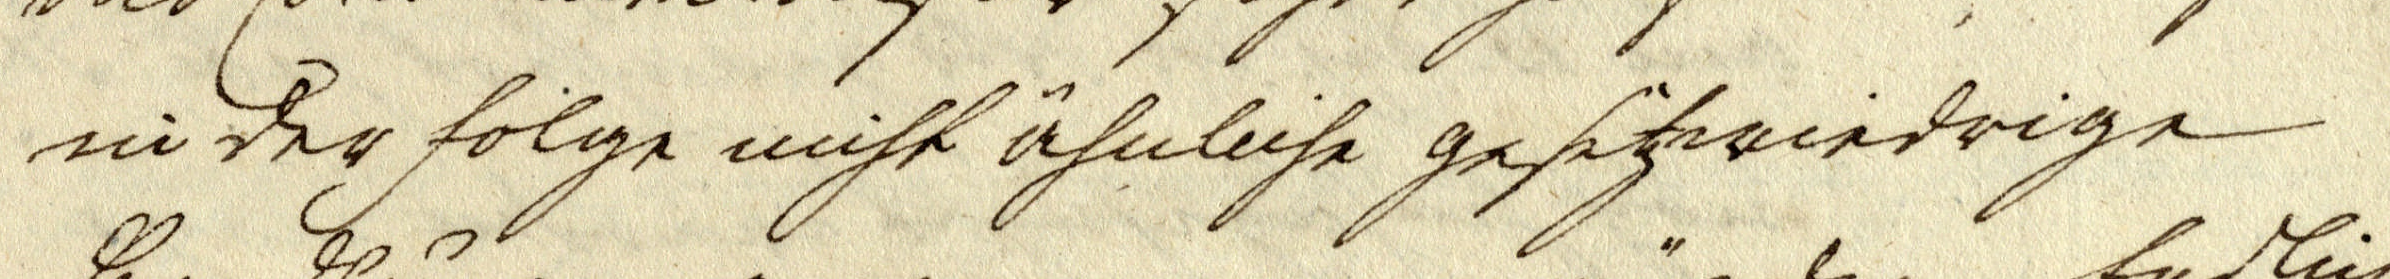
in der Folge nicht ähnliche gesetzwiedrige
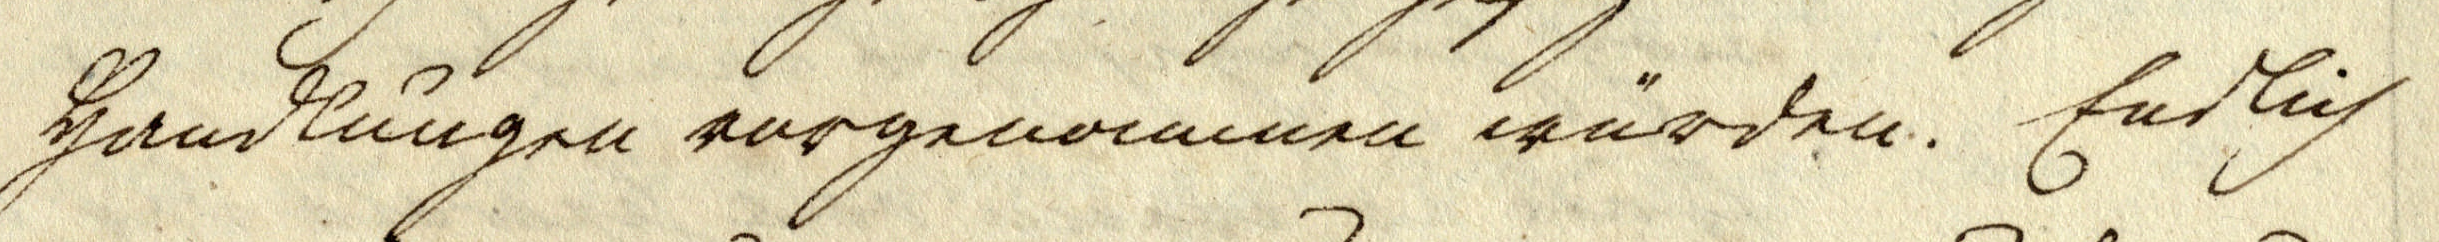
Handlungen vorgenommen würden. Endlich
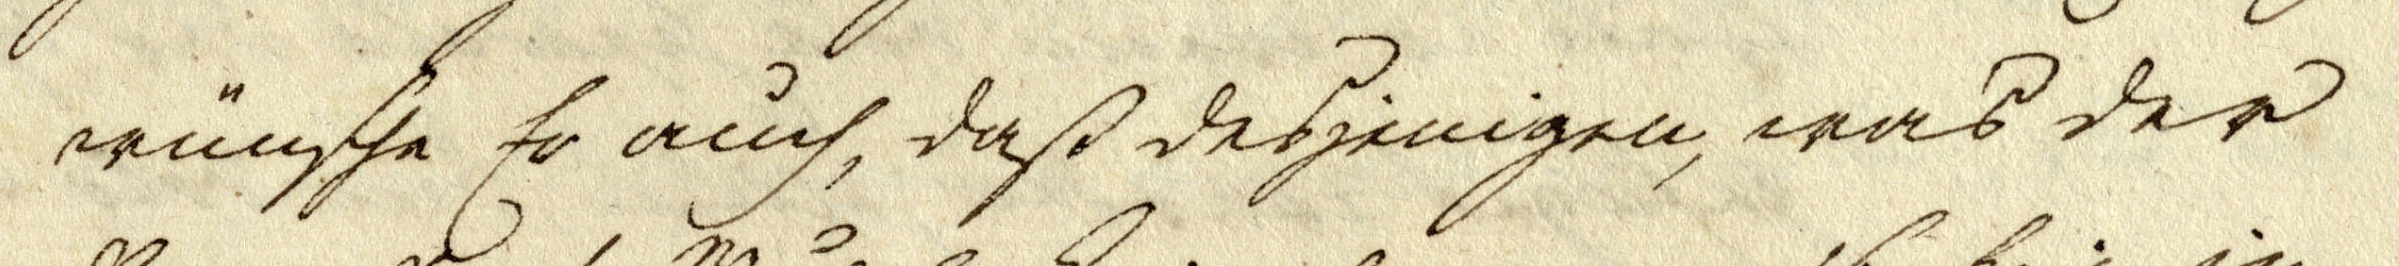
wünsche Er auch, daß desjenigen, was der
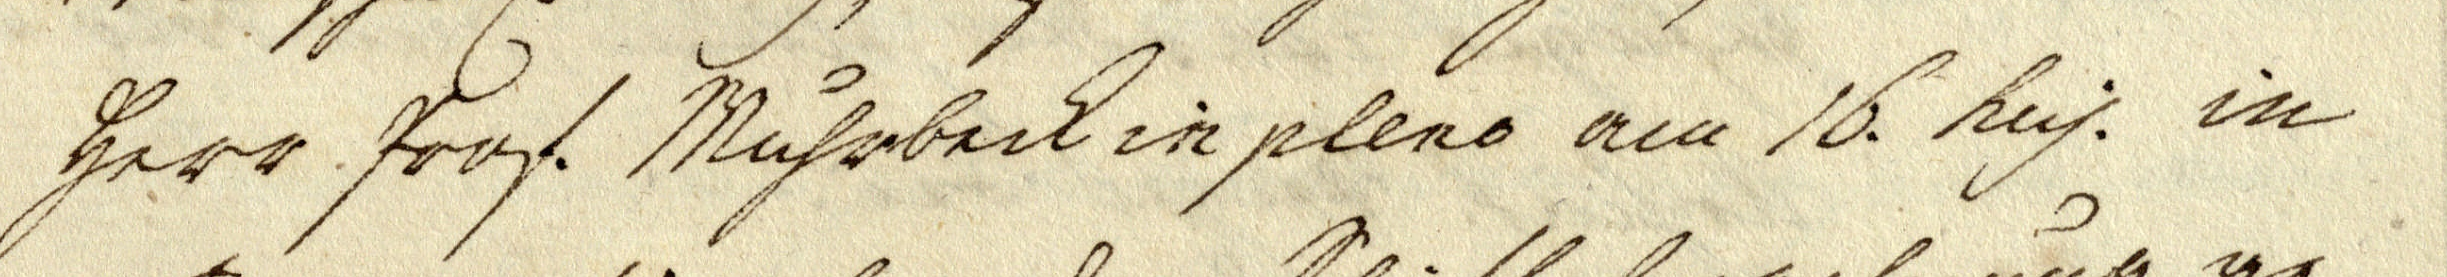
Herr Prof. Muhrbeck in pleno am 16. huj. in
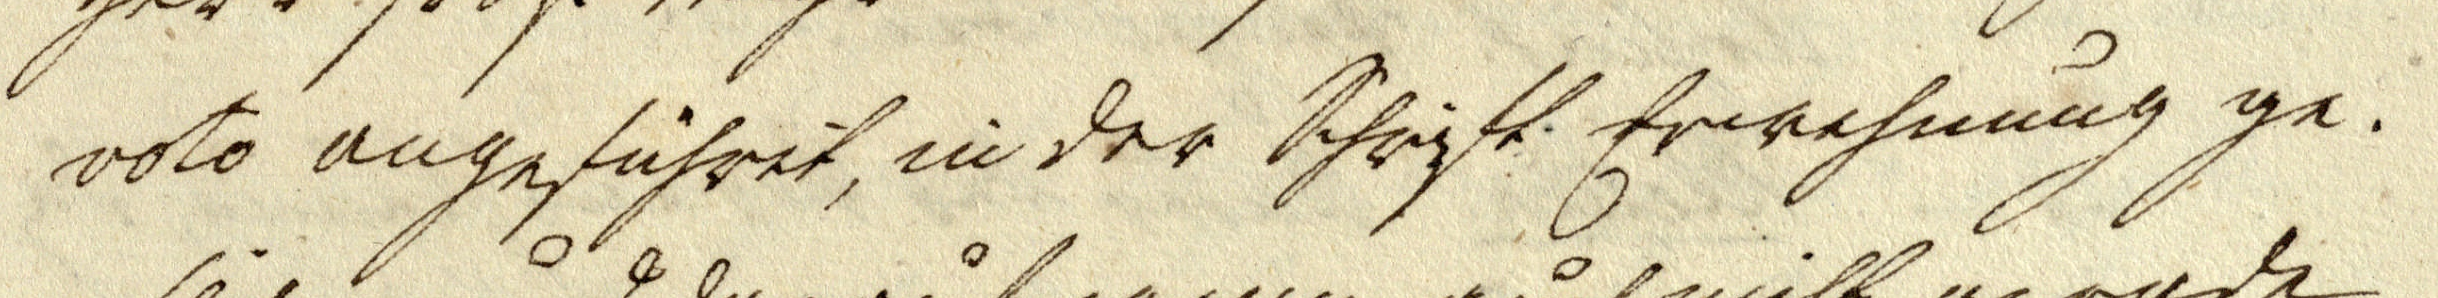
voto angeführet, in der Schrift Erwehnung ge¬
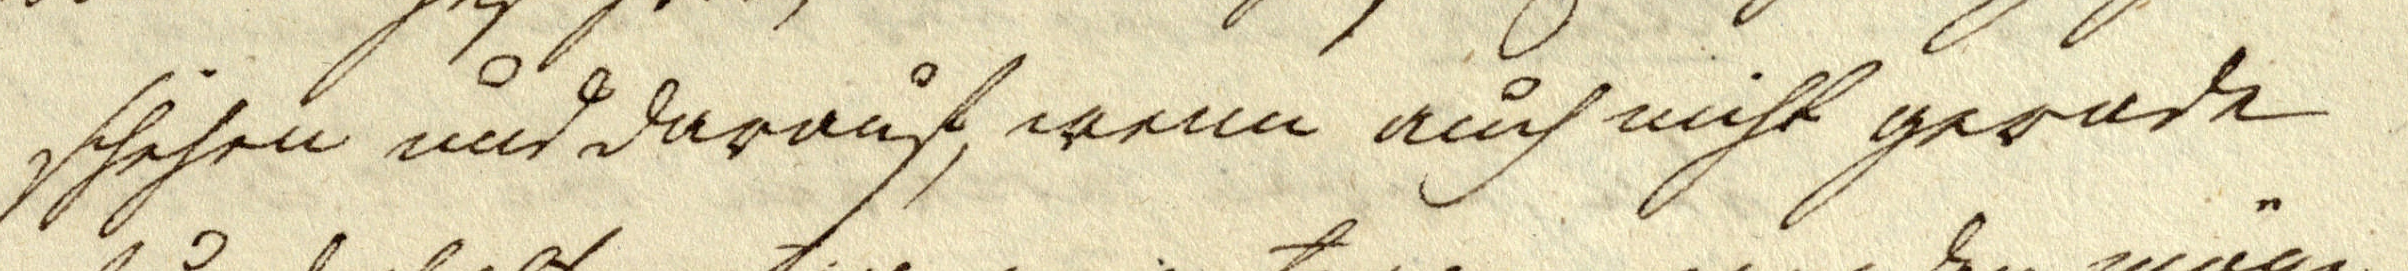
schehen und darauf, wenn auch nicht gerade
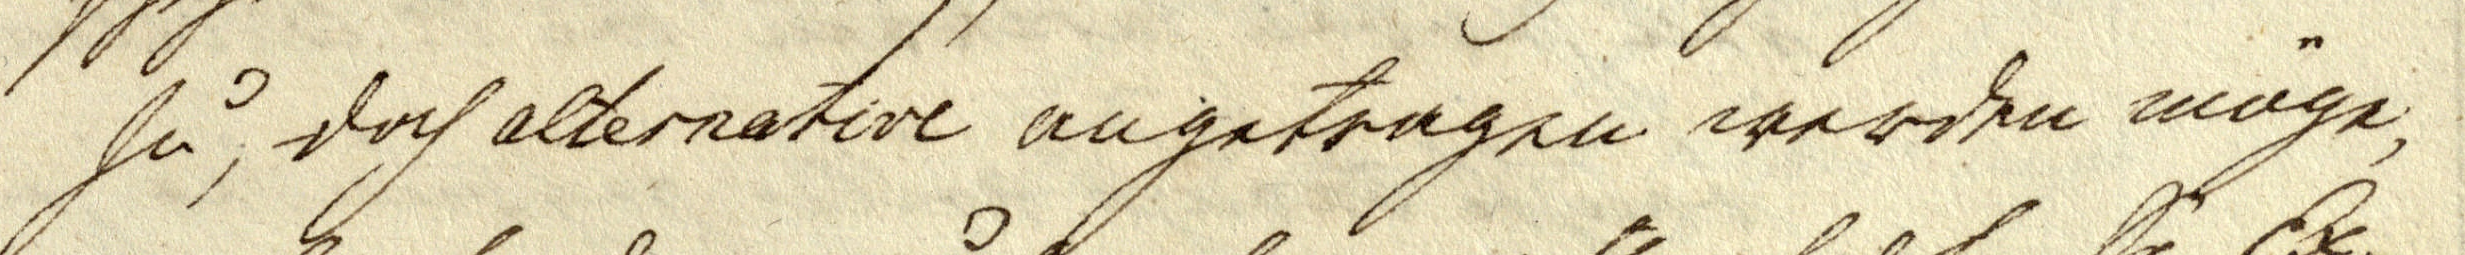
zu, doch alternative angetragen werden möge,
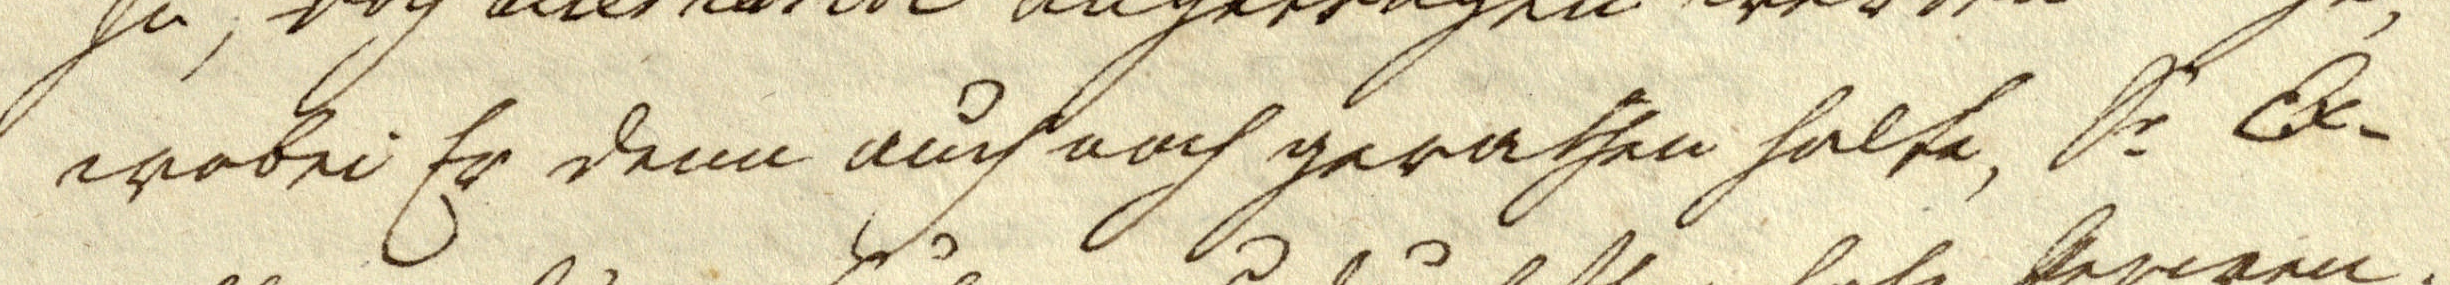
wobei Er denn auch noch gerathen halte, Sr Ex¬
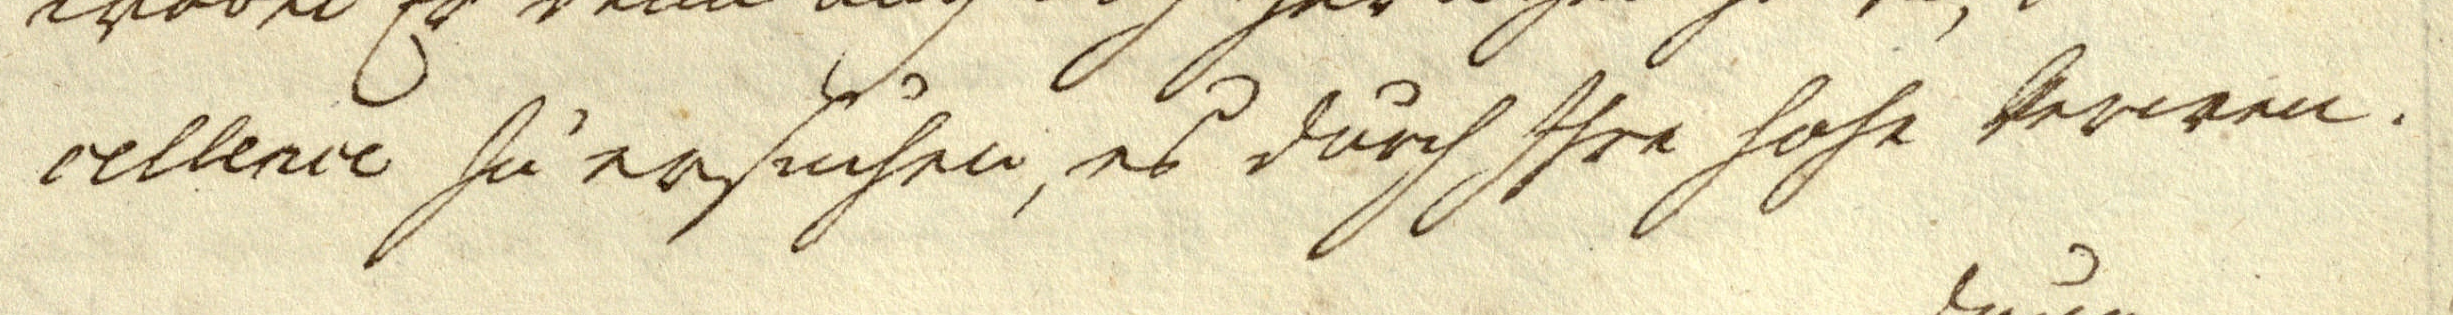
cellence zu ersuchen, es durch Ihre hohe Verwen¬
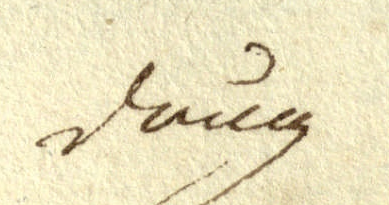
dung
